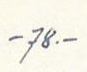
78
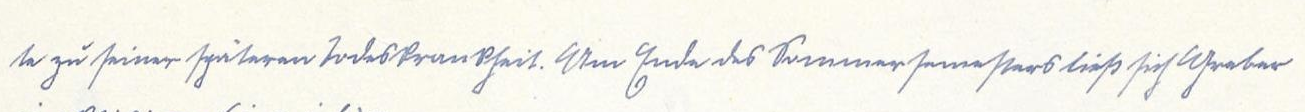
te zu seiner späteren Todeskrankheit. Am Ende des Sommersemesters ließ sich Greber
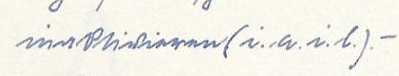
inskribieren (i. a.i .l.).-
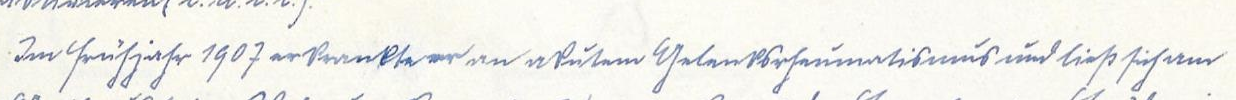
Im Frühjahr 1907 erkrankte er an akutem Gelenksrheumatismus und ließ sich am
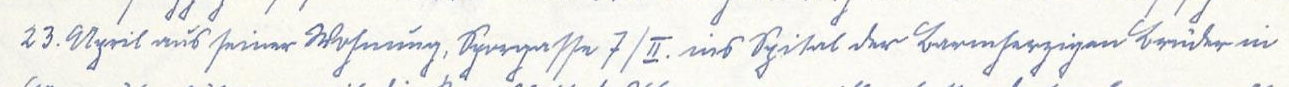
23. April aus seiner Wohnung, Sporgasse 7/II. ins Spital der Barmherzigen Brüder in
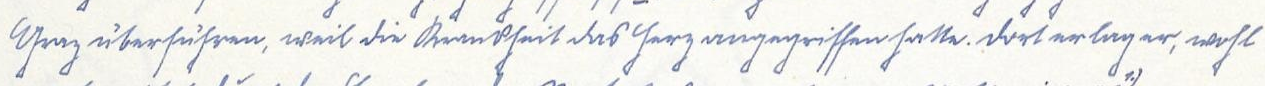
Graz überführen, weil die Krankleit das Herz angegriffen hatte. Dort erlag er, wohl
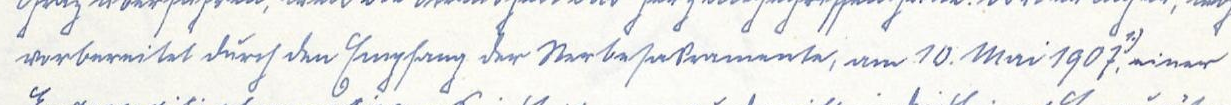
vorbereitet durch den Epfang der Sterbesakramente, am 10. Mai 1907 1) einer
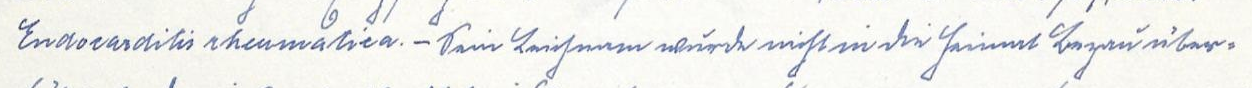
Endocarditis rheumatea. Sein Leichnan wurde nicht in die Heimat Bezau über-
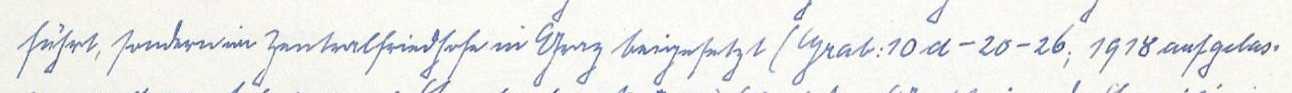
führt, sondern im Zentralfriedhofe in Graz beigesetzt (Grab.10d-20-26, 1918 aufgelas-
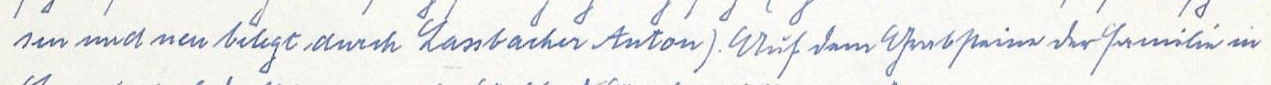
sen und neu belegt durch Lassbacher Anton) Auf dem Grabsteine der Familie in
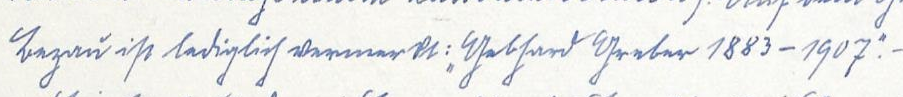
Bezau ist lediglich vermerkt:,„Gebhard Greber 1883- 1907)"
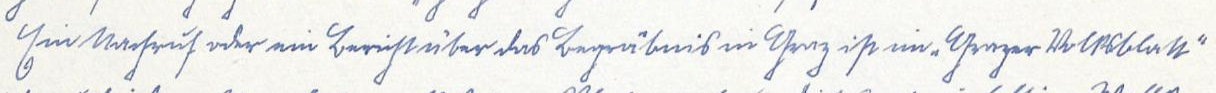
Ein Nachruf oder ein Bericht über das Begräbnis in Graz ist im "Grazer Volksblatt"
